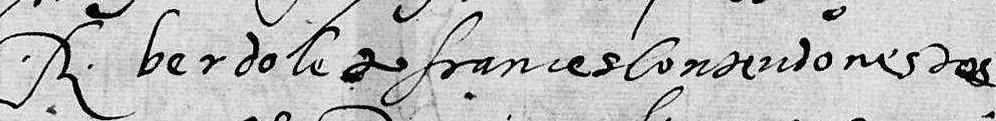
.R. berdoleto frances conteudo nestes
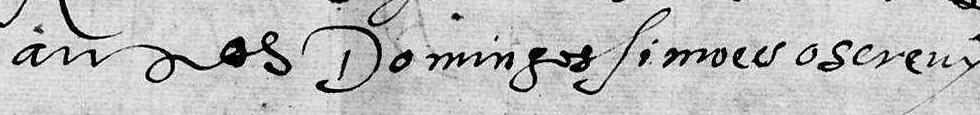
autos Domingos Simoees o screuy
